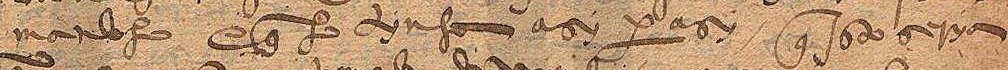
mandoho e q̅ ho tynha asy ꝑa sy / q̅ Jsto serya
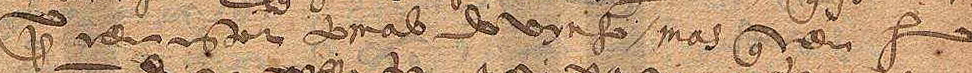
p̄o elle estar tomado do vynho / mas q̄ elle ho
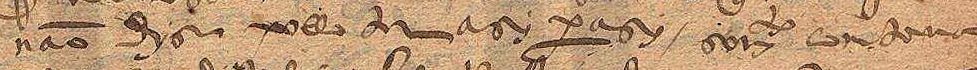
não dyse pollo ter asy ꝑa sy / somꝭ comtaua
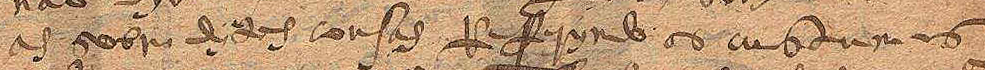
as sobredytas cousas Referyndo os custumes
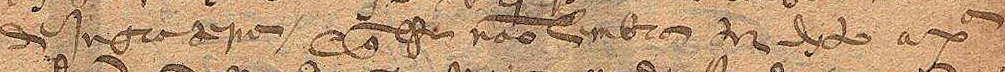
de Jngraterra / e q̅ lhe não lembra ter dyto a pa
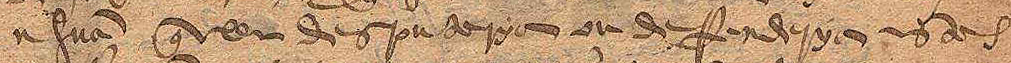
nhu̅a q̅ elle desputerya ou defenderya estas
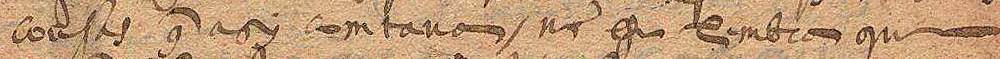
cousas q̅ asy comtaua / ne̅ lhe lembra que
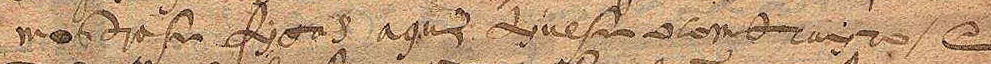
mostrase fygas a que̅ tyuese o comtrayro / e
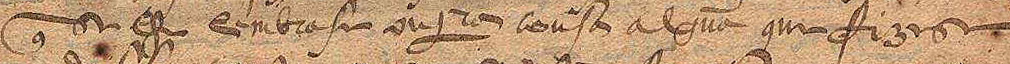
q̄ se lhe lembrase outra cousa algūa que fizese
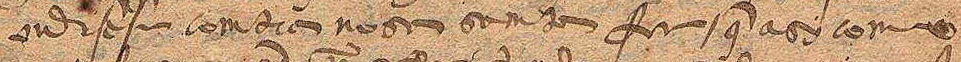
ou disese comtra nosa samta fee / q̅ asy como
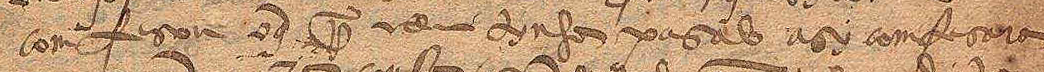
comfesou o q̅ p̅o elle tynha pasado asy comfesara
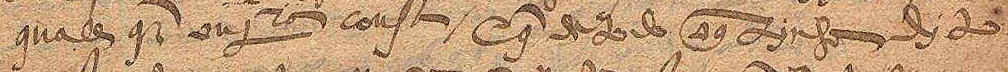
quallq̄r outra cousa / e q̅ de todo o q̅ tynha dyto
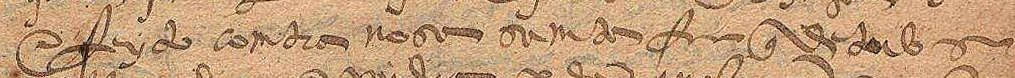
e feyto comtra nosa samta fee q̅ de tudo se
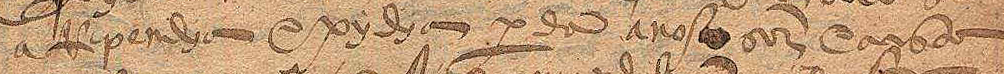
aRepemdya e pydya ꝑda̅ a nosso sōr e a esta
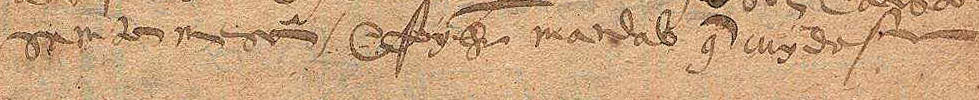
samta mesa / e foy lhe mandado q̅ cuydase
